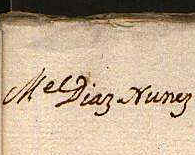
Mel Diaz Nunez
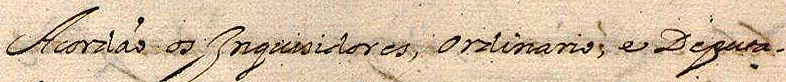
Acordaõ os Jnquisidores, ordinario; e Deputa
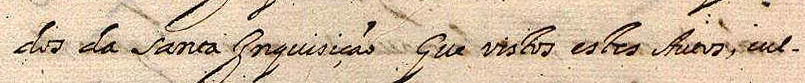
dos da santa Jnquisiçaõ que vistos estes Autos, cul
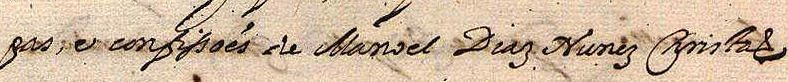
pas, e confissoẽs de Manoel Diaz Nunez Christaõ
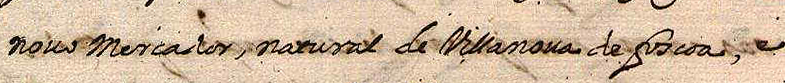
nouo mercador, natural de Villa noua de foscoa, e
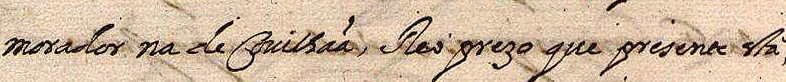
morador na de Couilhaã, Reo prezo que presente està,
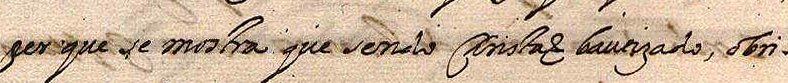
perque se mostra que sendo Christaõ bautizado, obri
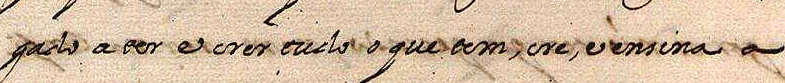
gado a ter e crer tudo o que tem, cre, e ensina a
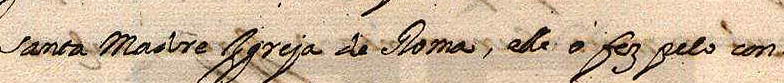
santa Madre Jgreja de Roma, elle o fez pelo con
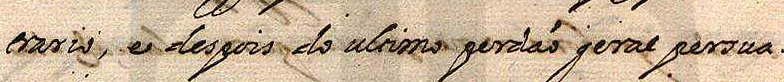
trario, e despois do ultimo perdaõ geral persua
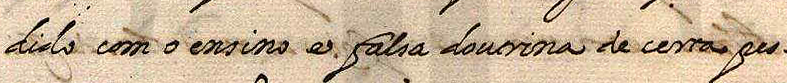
dido com o ensino e falsa doutrina de certa pes
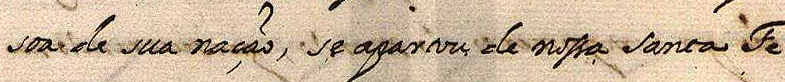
soa de sua naçaõ, se apartou de nossa santa Fe
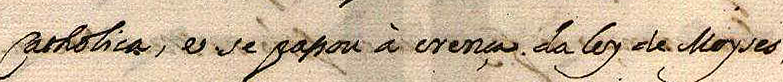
Catholica, e se passou à crença da ley de Moyses,
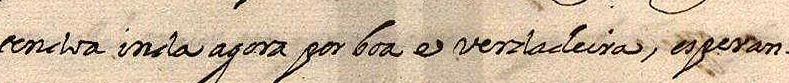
tendoa inda agora por boa e verdadeira, esperan
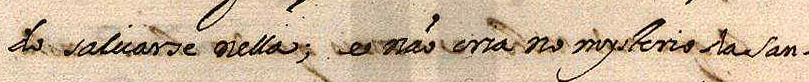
do salvar se nella; e naõ cria no mysterio da san
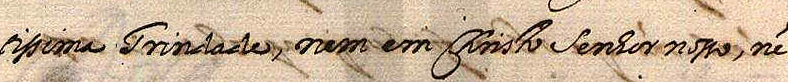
tissima Trindade, nem em Christo Senhor nosso, nẽ
